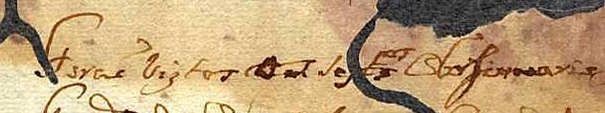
Foraõ Viztos os testos Obo sumario
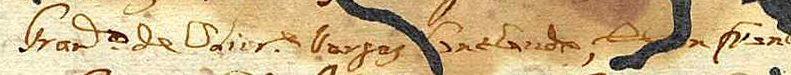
Fran.co de OLivr.a Vargas Contheudo, E nfron
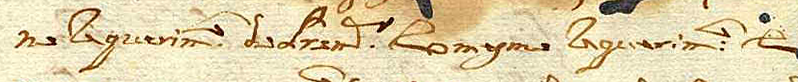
no Requerim.to do Prom.or E o mesmo Requerimto: E
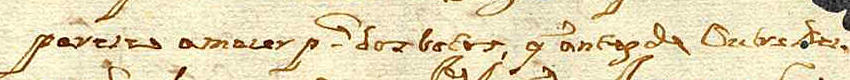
pareseo a maior p.te dos votos, q̄ antes de Outro Des
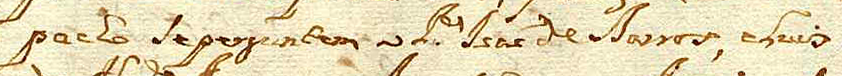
pacho se perguntem o P.e Ioaõ de Barros, e Luis
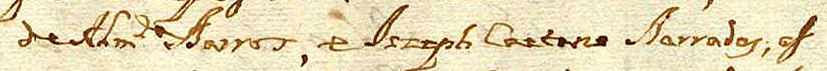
de Alm.da Barros, e Iozeph Caetano Barradas, as
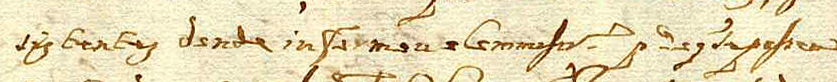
sistentez donde informou o Commissr.o p.a o q̄ se passem
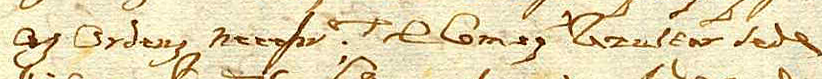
az Ordenz necessar.as E Com o q̄ Rezultar se de
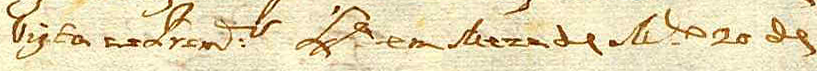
Vizta ao Prom.or Lxa em Meza de M.co 20 de
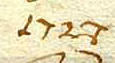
1728
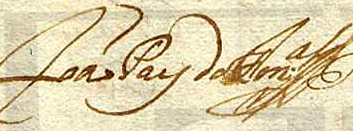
João Paes do Am.al
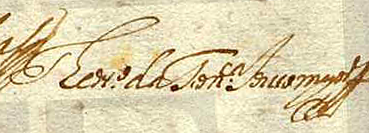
Theot.o da Fon.ca Souttomayor
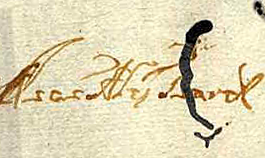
Joaõ Alez̄ Soarez
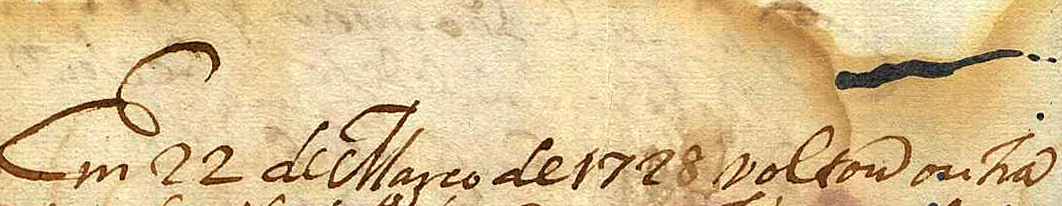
Em 22 de Março de 1728 voltou outra
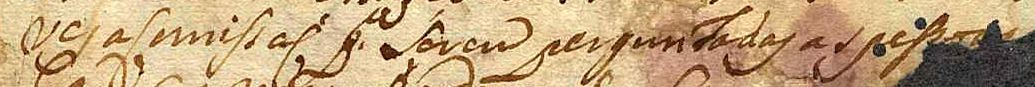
ves a Comissaꝭ p.a serem perguntadas as pessoas
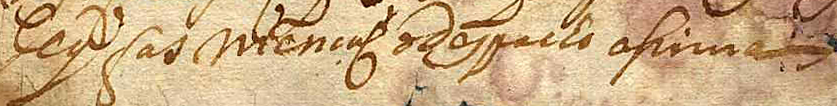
de q̄ fas mençaõ o despacho assima
